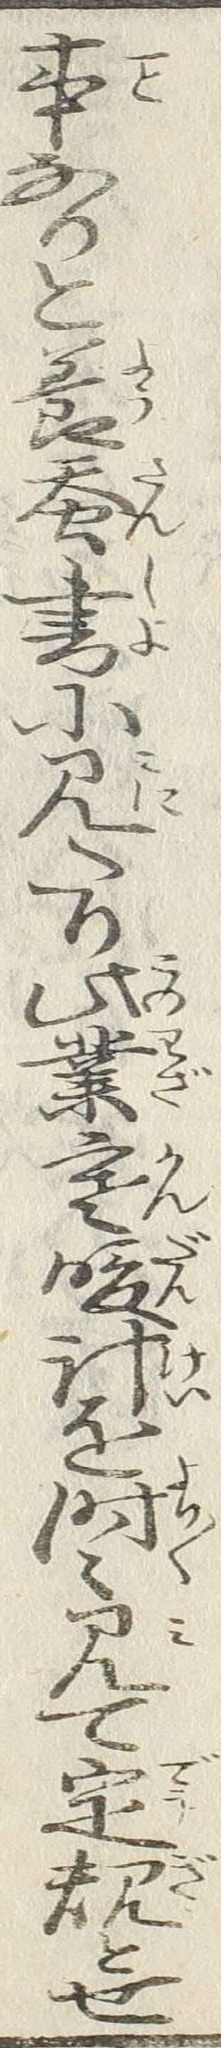事なりと養蚕書に見たり此業寒暖計を時々見て定規とせ
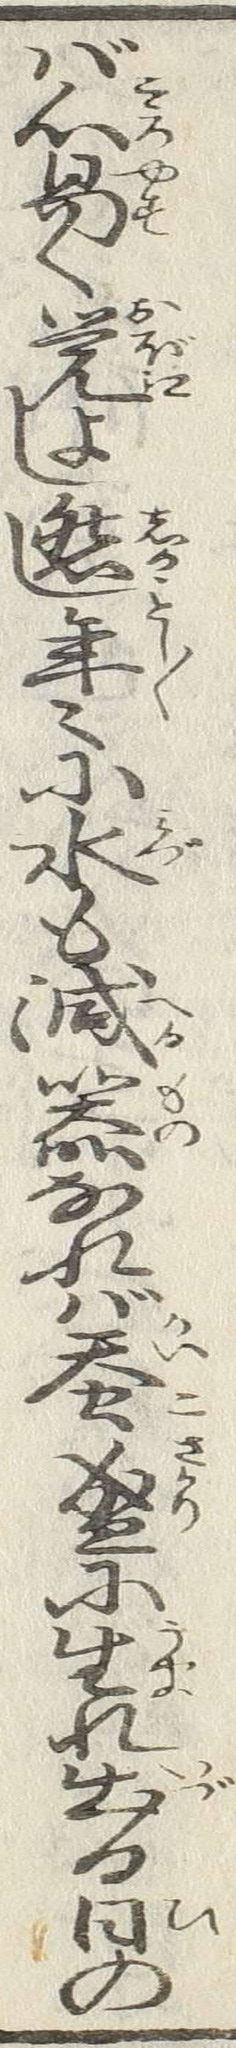ば心易く覚よし然し年々に水も減器なれば蚕盛に生れ出る日の
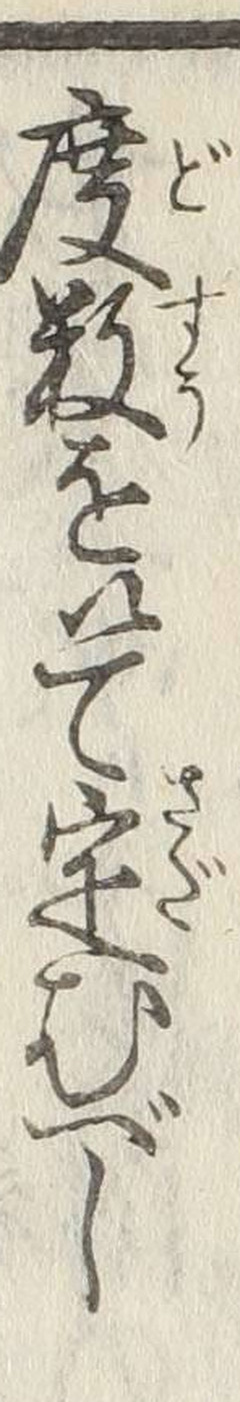度数を以て定むべし
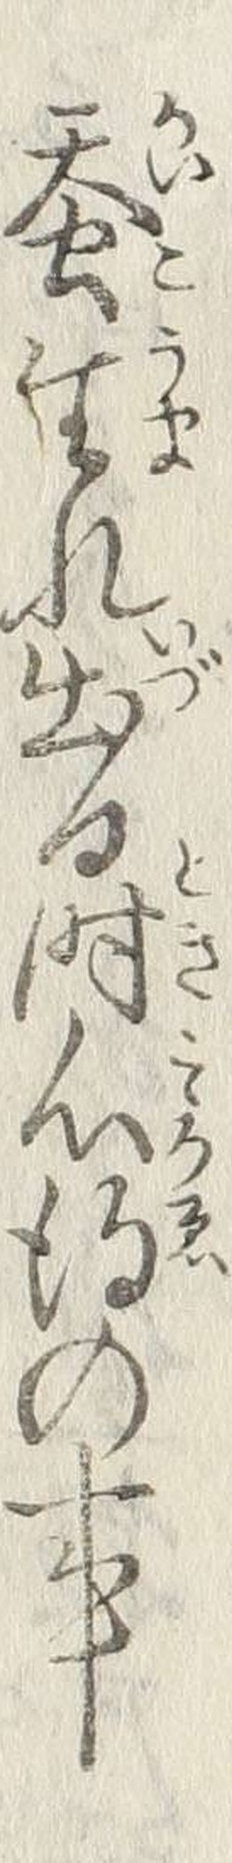蚕生れ出る時心得の事
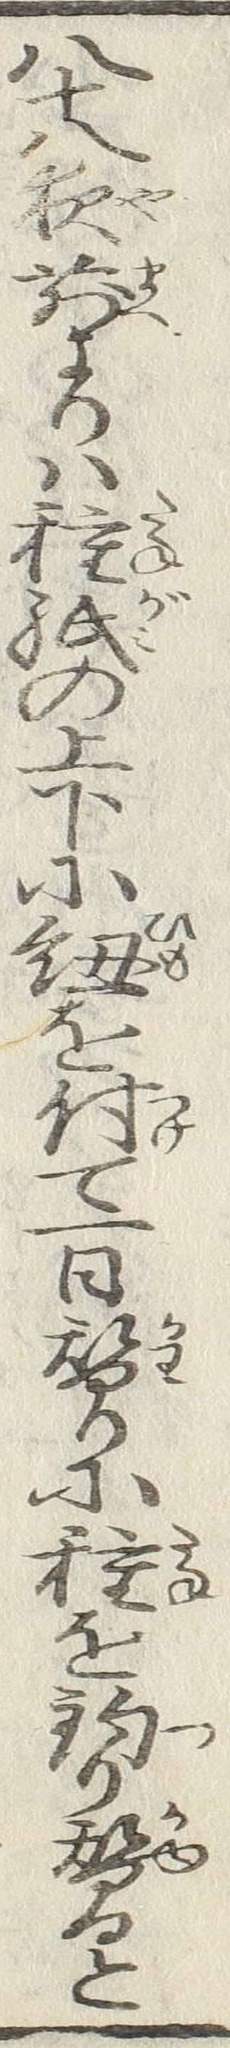八十八夜前よりは種紙の上下に紐を付て一日替りに種を釣り替ると
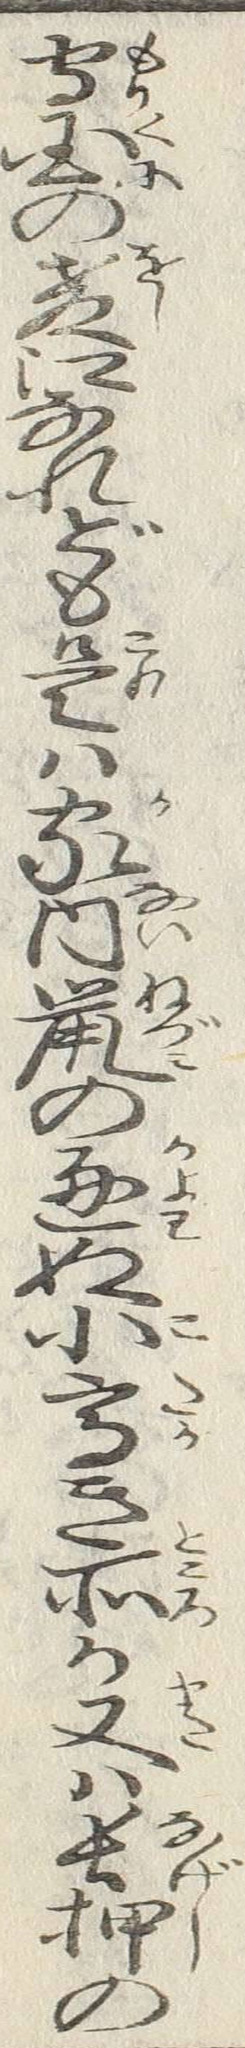守国の教えなれども是は家内鼠の通ぬ小高き所か又は長押の
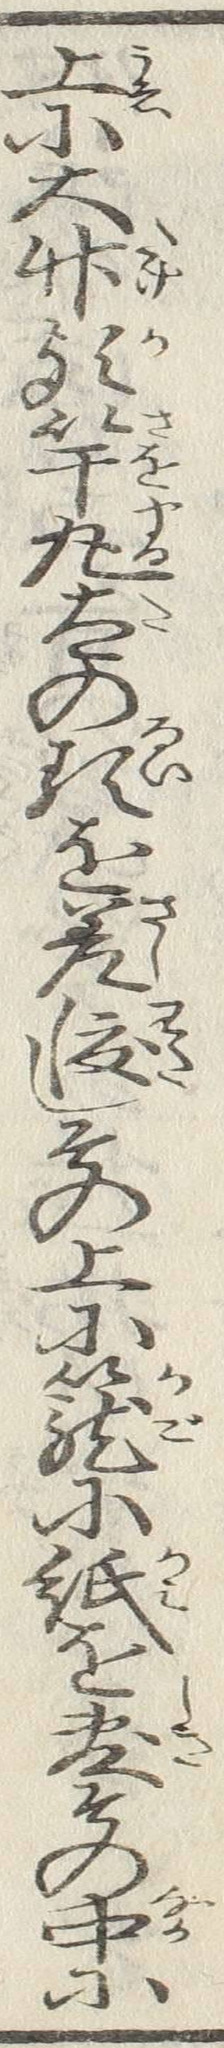上に大竹歟竿丸太の類を差渡しその上に籠に紙を敷その中に
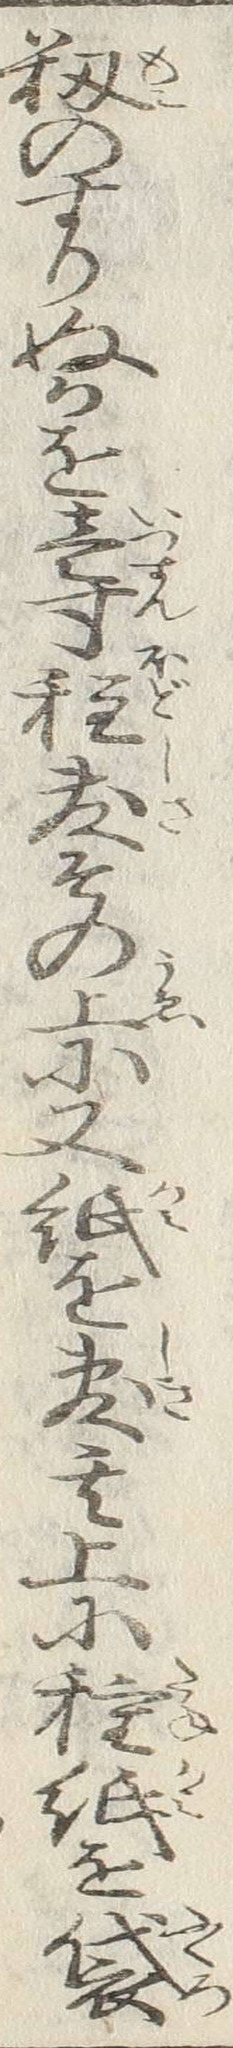籾のすりぬかを壱寸程敷その上に又紙を敷其上に種紙を袋
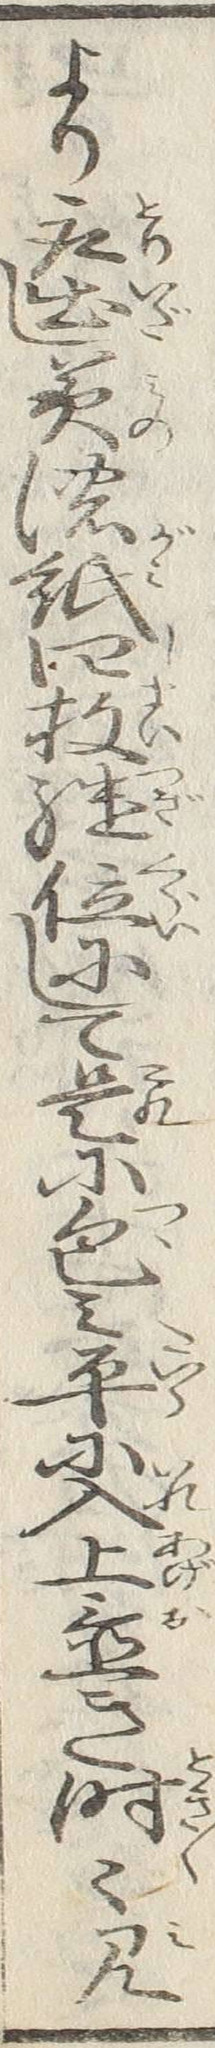より取出し美濃紙四枚継位にして是に包み平に入上置き時々見

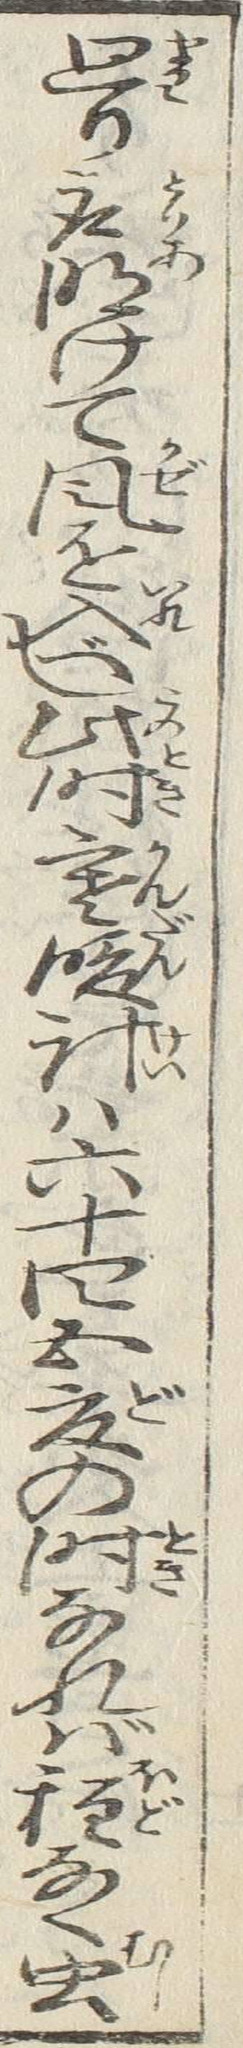廻り取明けて風を入べし此時寒暖計は六十四五度の時なれば程なく虫
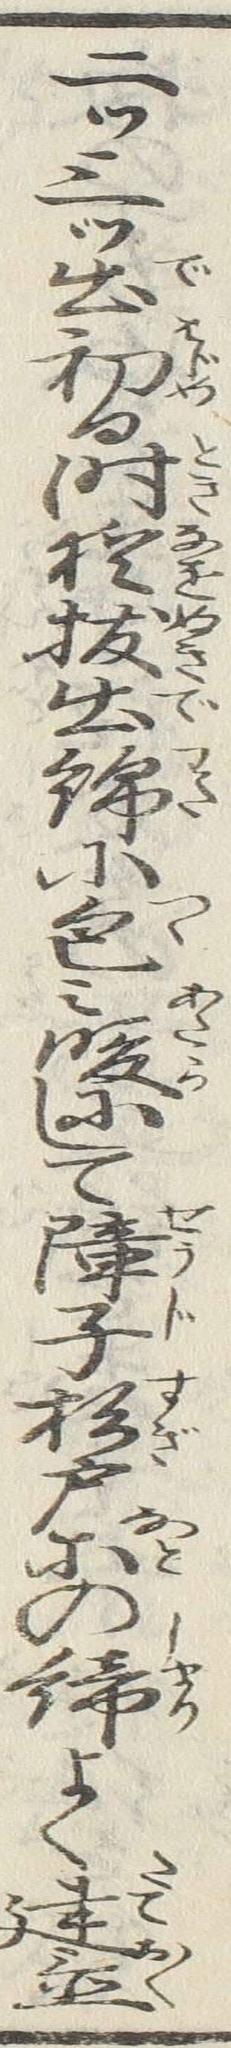二ッ三ッ出初る時猶抜出綿に包み暖にして障子杉戸等の締よく建置
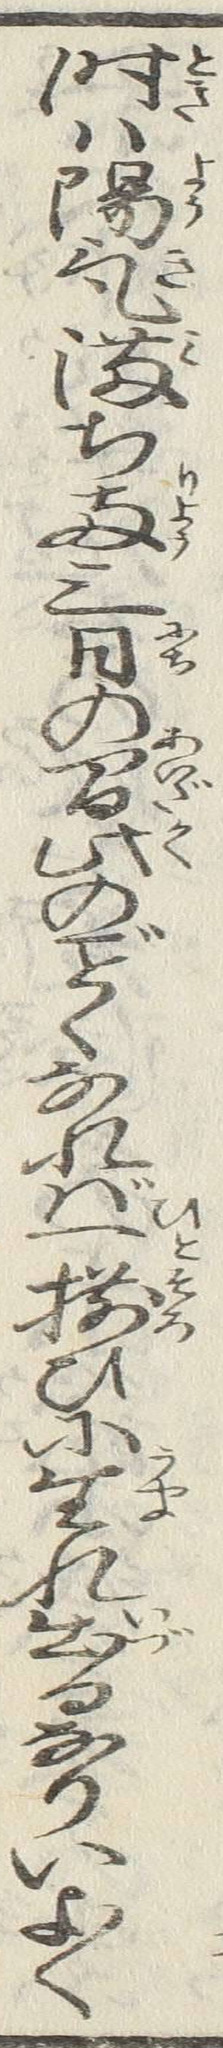時は陽気満ち両三日の間此のごとくなれば一揃ひに生れ出るなりいよ〳〵
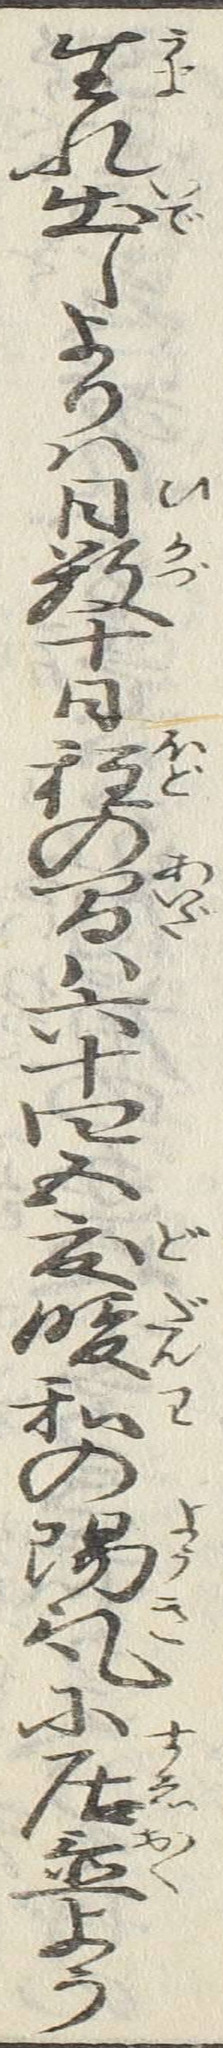生れ出しよりは日数十日程の間は六十四五度暖和の陽気に居置よう
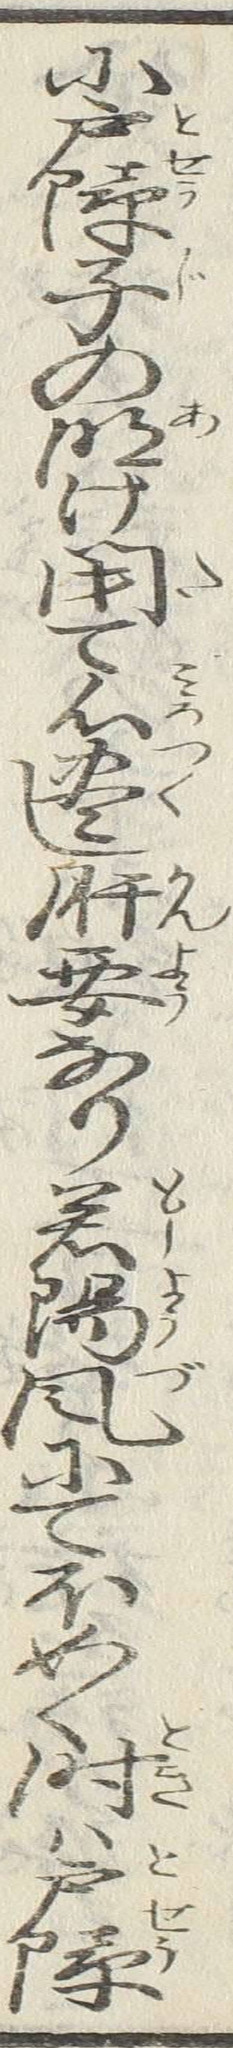に戸障子の明け閉て心盡し肝要なり若陽風にてほめく時は戸障
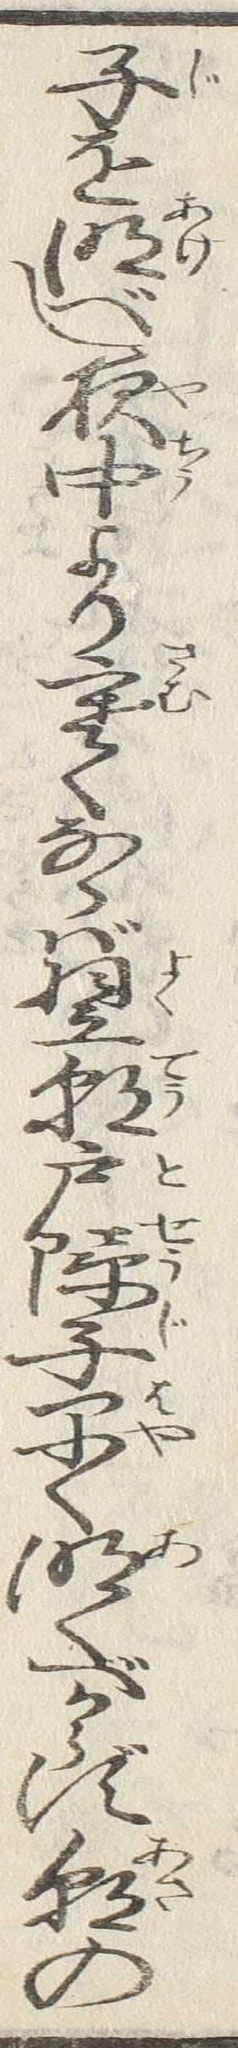子を明べし夜中より寒くならば翌朝戸障子早く明くべからず朝の
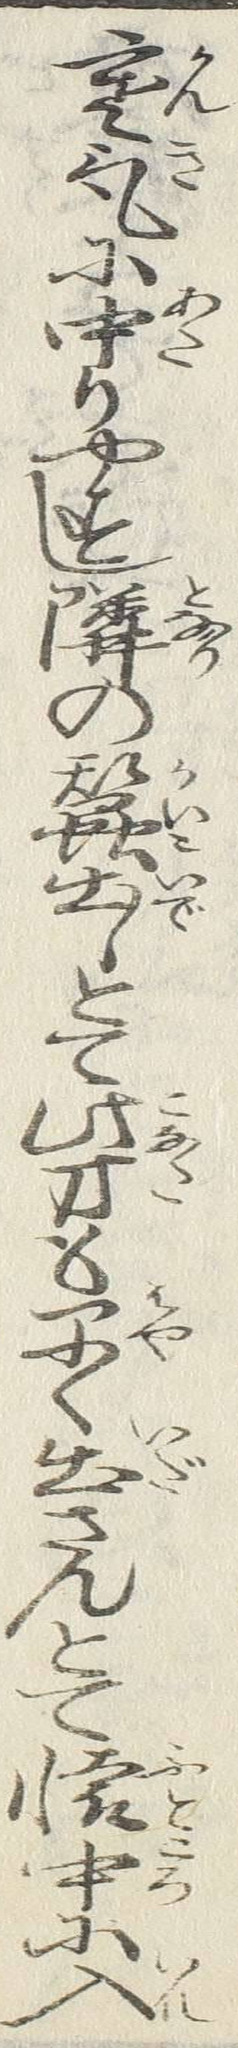寒気に中りやすし隣の蠶出しとて此方も早く出さんとて懐中に入
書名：養蠶實驗録
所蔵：東京大学農学生命科学図書館 国文学研究資料館
